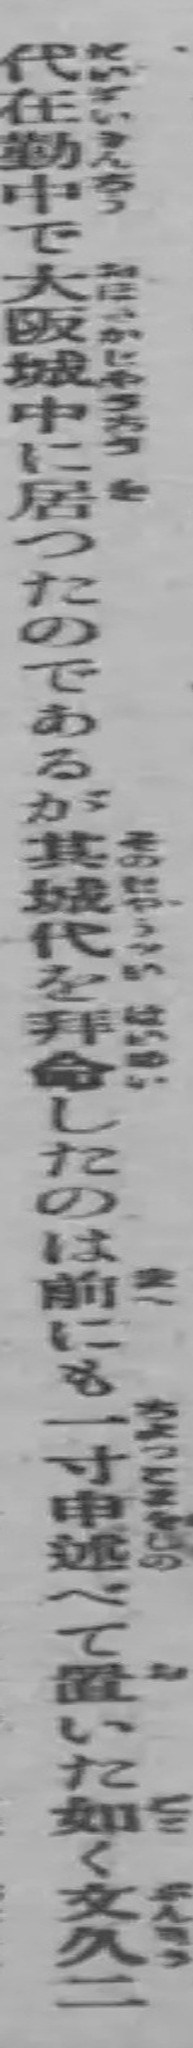代在勤中で大阪城中に居つたのであるが其城代を拝命したのは前にも一寸申述べて置いた如く文久二
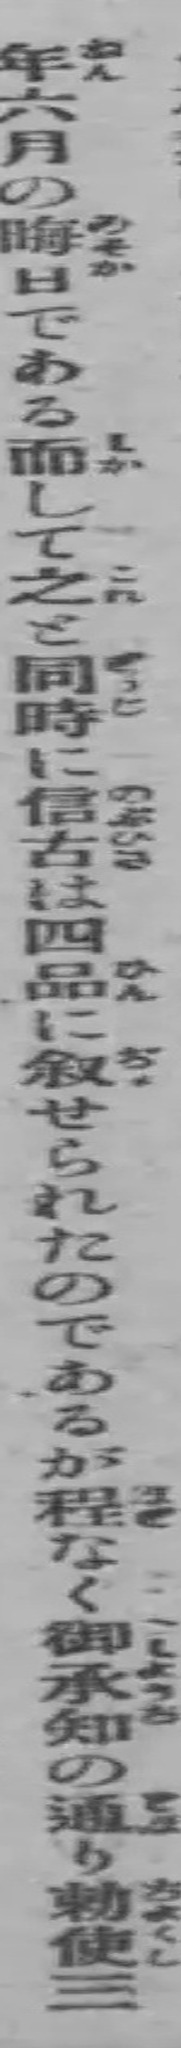年六月の晦日である而して之と同時に信古は四品に叙せられたのであるが程なく御承知の通り勅使三
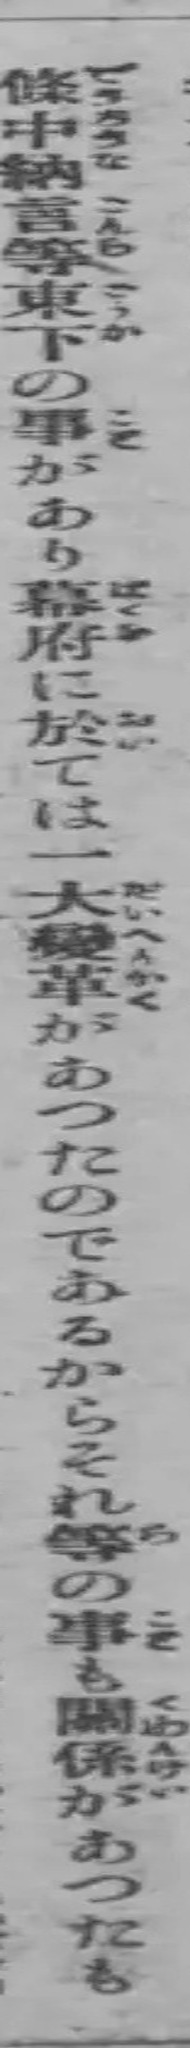條中納言等東下の事があり幕府に於ては一大変革があつたのであるからそれ等の事も関係があつたも
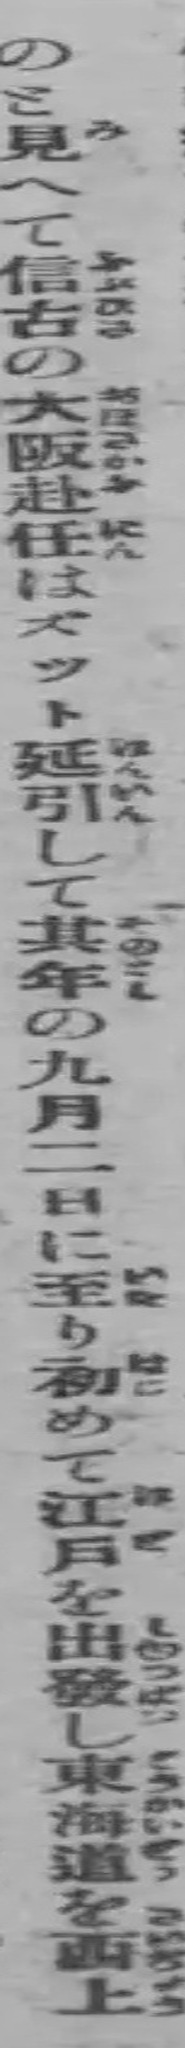のと見へて信古の大阪赴任はズツト延引して其年の九月二日に至り初めて江戸を出発し東海道を西上
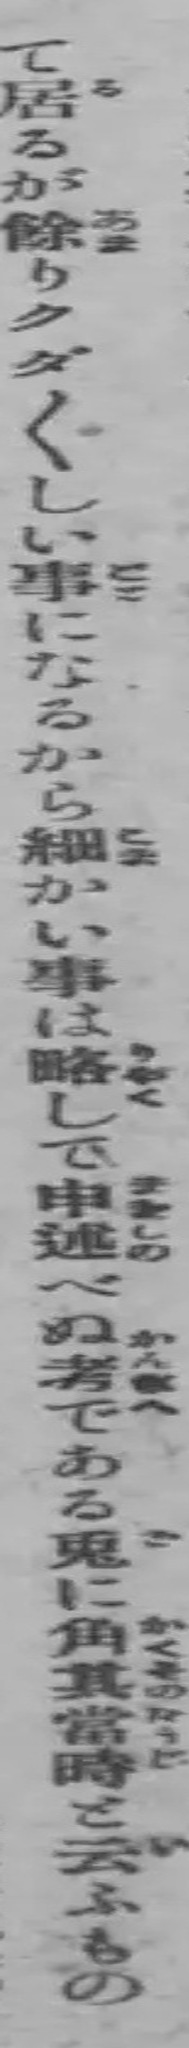て居るが余りクダ〳〵しい事になるから細かい事は略して申述べぬ考である兎に角其当時と云ふもの
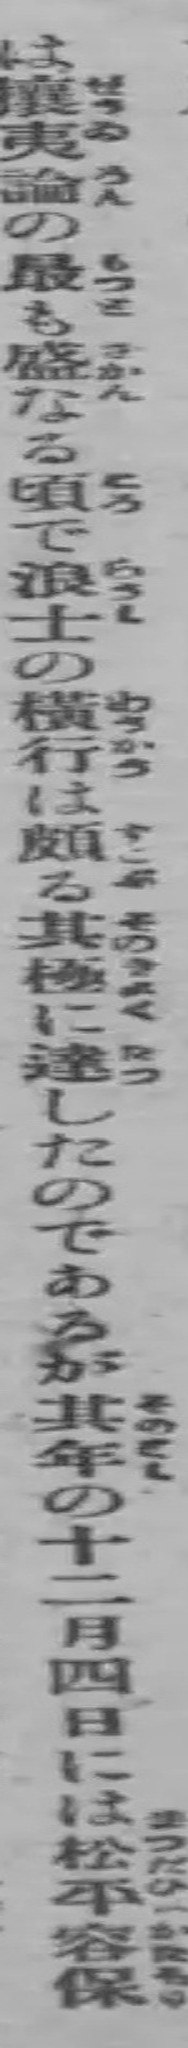は攘夷論の最も盛なる頃で浪士の横行は頗る其極に達したのであるが其年の十二月四日には松平容保
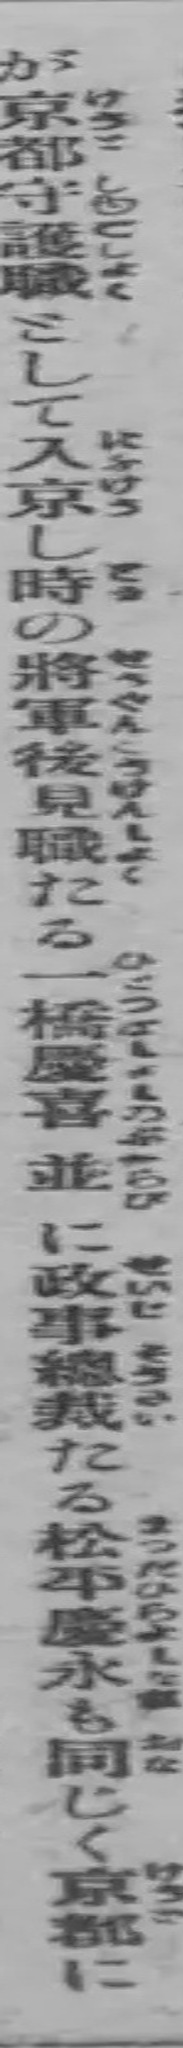が京都守護職として入京し時の将軍後見樴たる一橋慶喜並に政事総裁たる松平慶永も同じく京都に
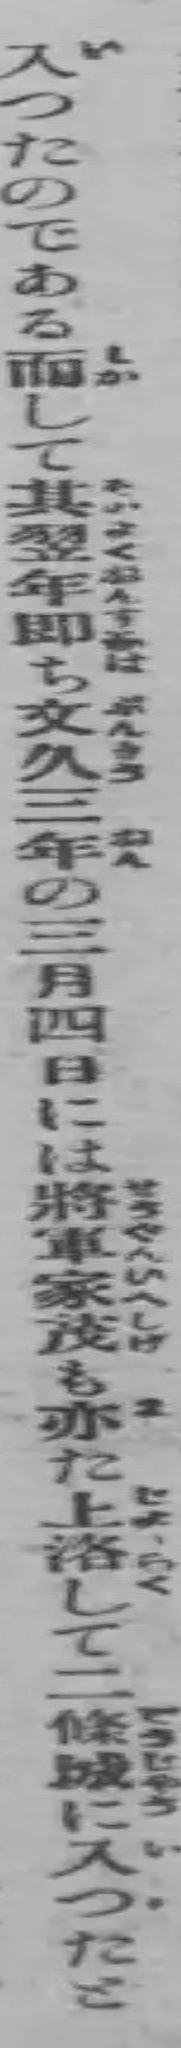入つたのである而して其翌年即ち文久三年の三月四日には将軍家茂も亦た上洛して二条城に入つたと
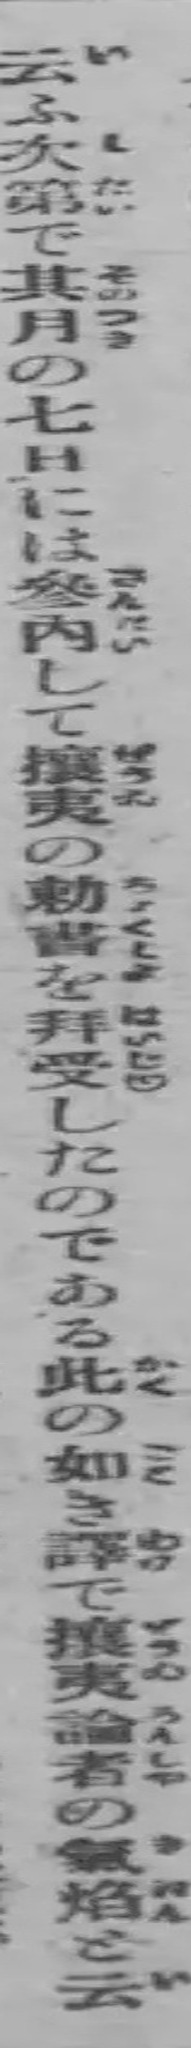云ふ次第で其月の七日には参内して攘夷の勅書を拝受したのである此の如き訳で攘夷論者の気焔と云
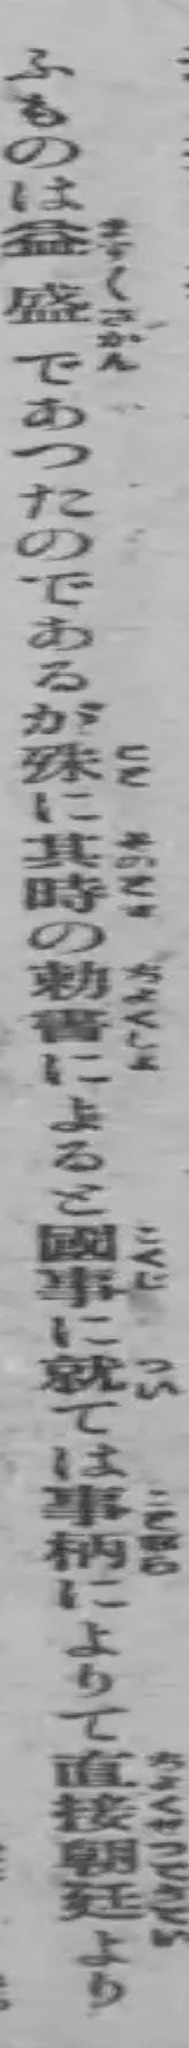ふものは益盛であつたのであるが殊に其時の勅書によると国事に就ては事柄によりて直接朝廷より
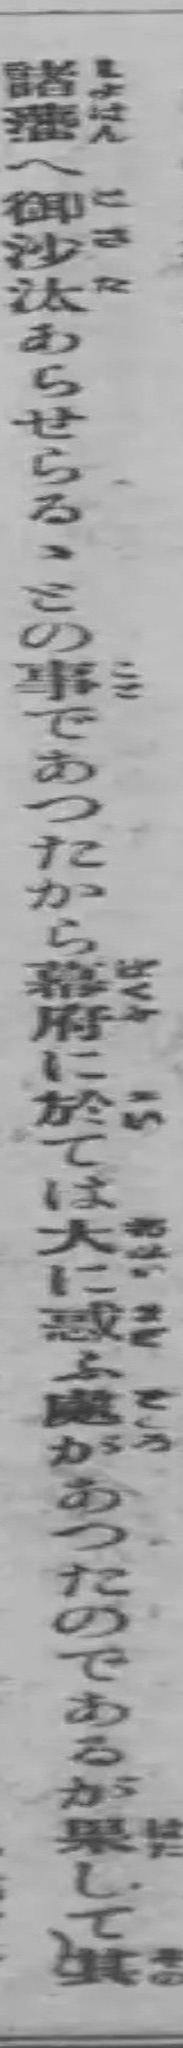緒藩へ御沙汰あらせらるゝとの事であつたから幕府に於ては大に惑ふ処があつたのであるが果して其
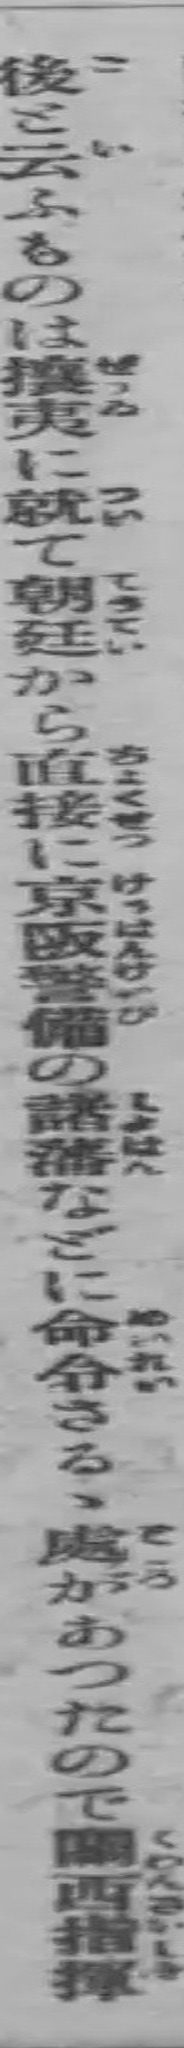後と云ふものは攘夷に就て朝廷から直接に京阪警備の緒藩などに命令さるゝ処があつたので関西指揮
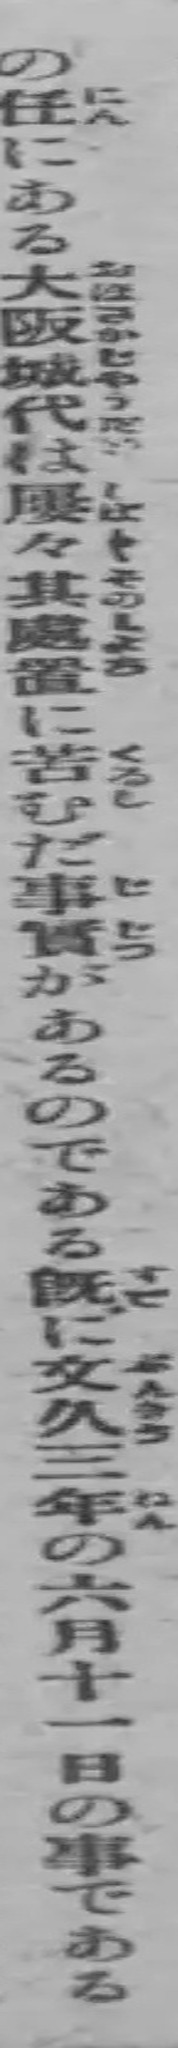の任にある大阪城代は屡々其処置に苦むだ事実があるのである既に文久三年の六月十一日の事である
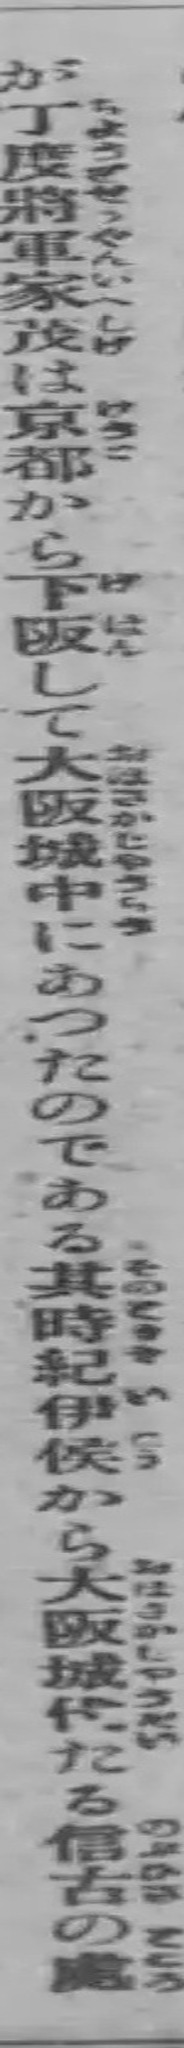攘夷の布告が丁度将軍家茂は京都から下阪して大阪城中にあつたのである其時紀伊侯から大阪城代たる信古の処
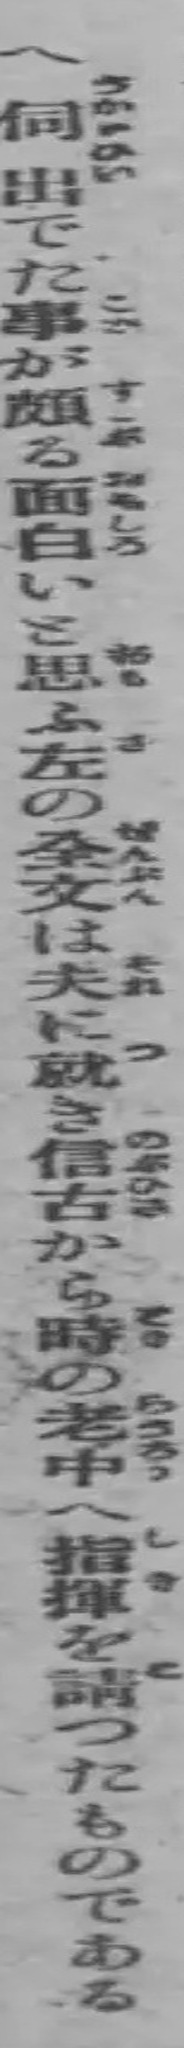へ伺出でた事が頗る面白いと思ふ左の全文は夫に就き信古から時の老中へ指揮を請つたものである
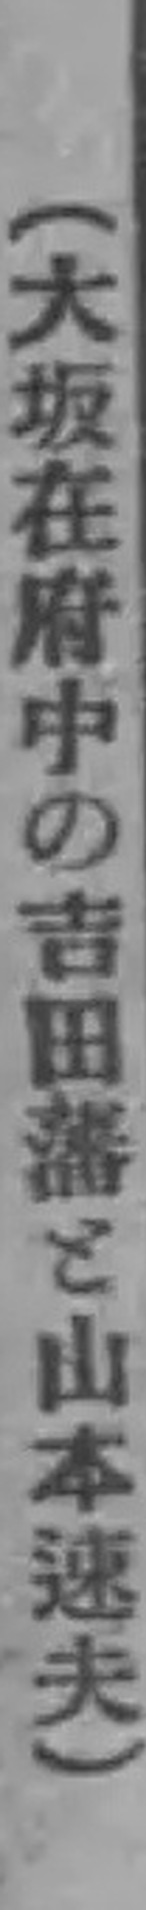⦿大阪在府中の吉田藩と山本速夫
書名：豊橋市史談
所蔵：国立国会図書館 National Diet Library, JAPAN
